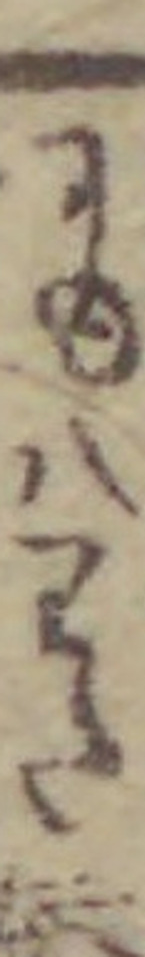にも八わた
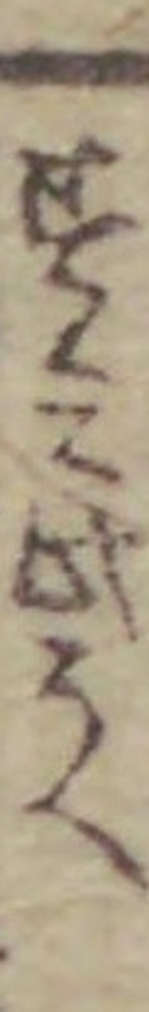すみ此うへ
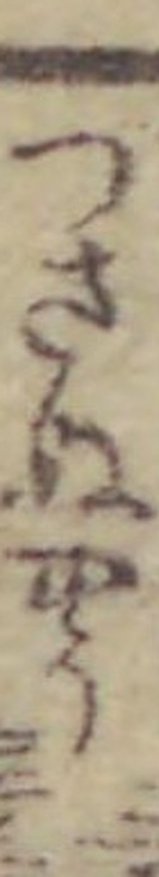つさぬやう
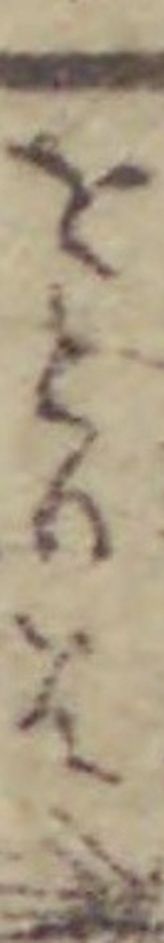をとりは
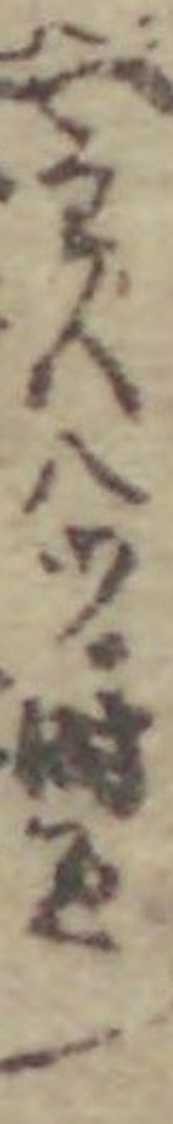主人八ツ時過
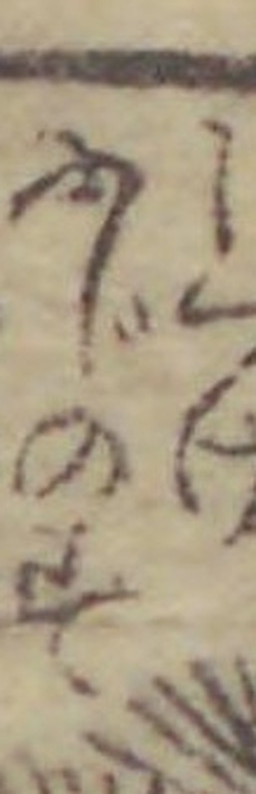ふじのす
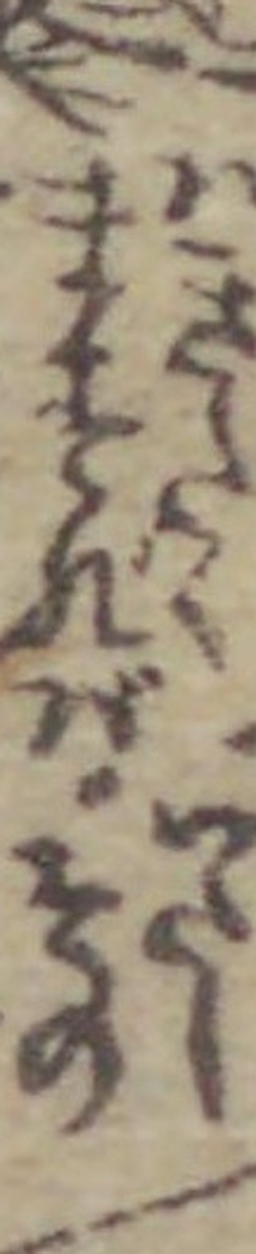ますればその
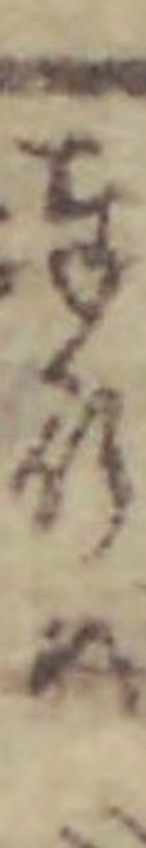奉行は
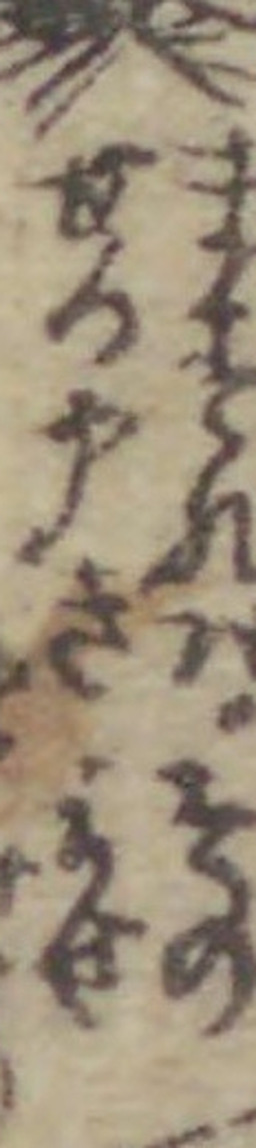せつ申きかせ
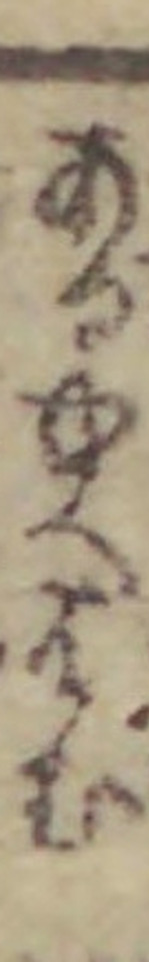あるゆへはむ
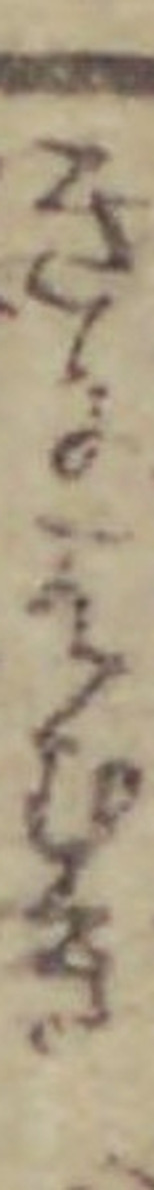きにはむき
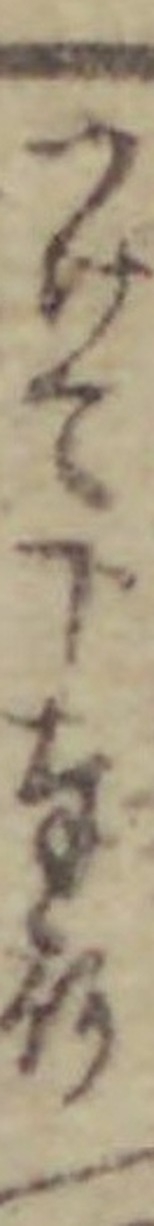つけて下奉行
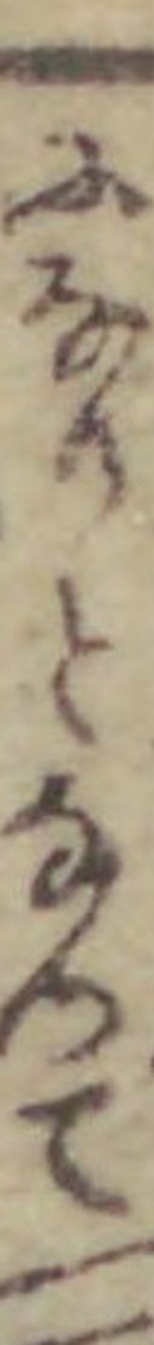になりとなつて
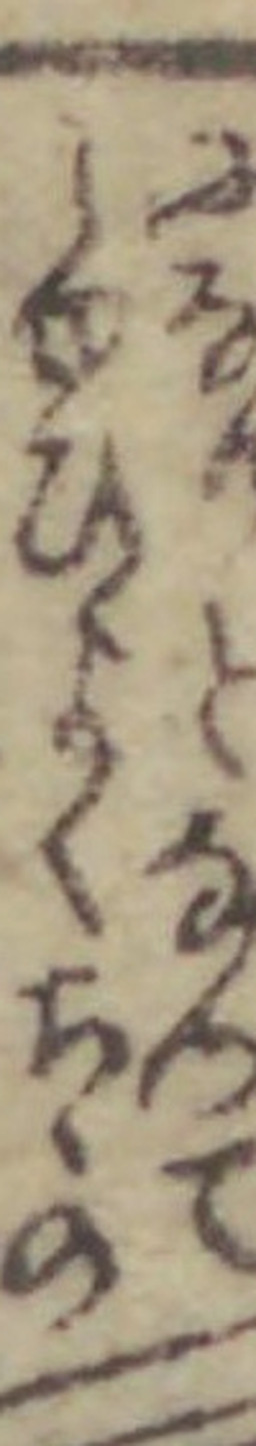しゆひよくちゝの
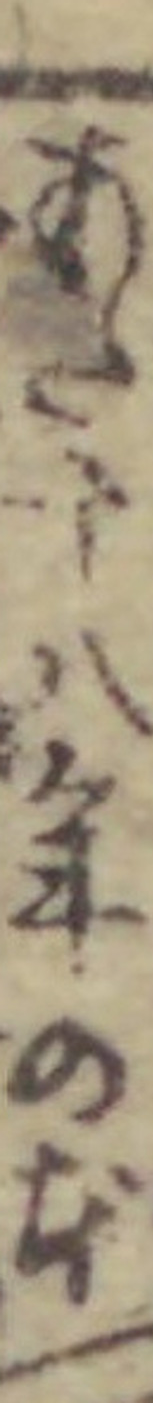あた十八年の本
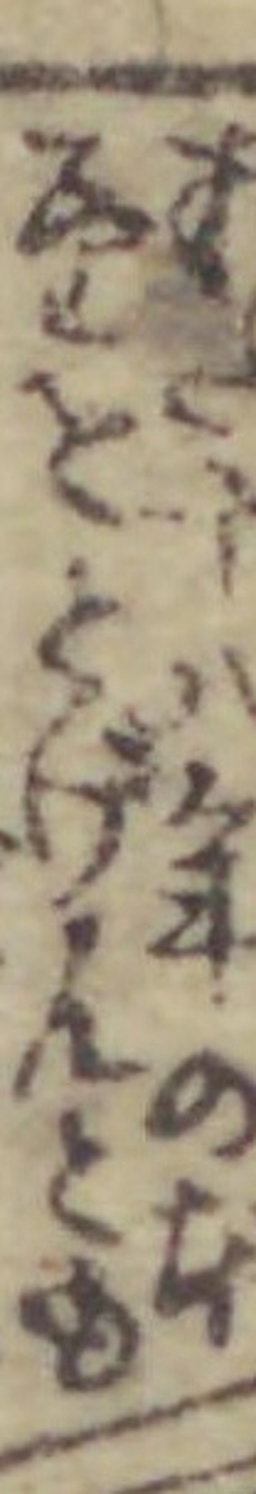望をとげんとも
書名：間似合嘘言曽我 3巻
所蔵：国立国会図書館 National Diet Library, JAPAN
